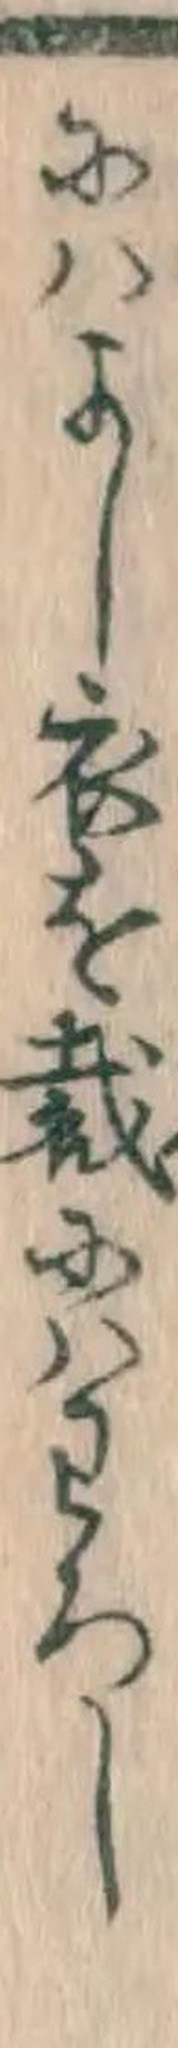にはよし衣を裁にはわろし
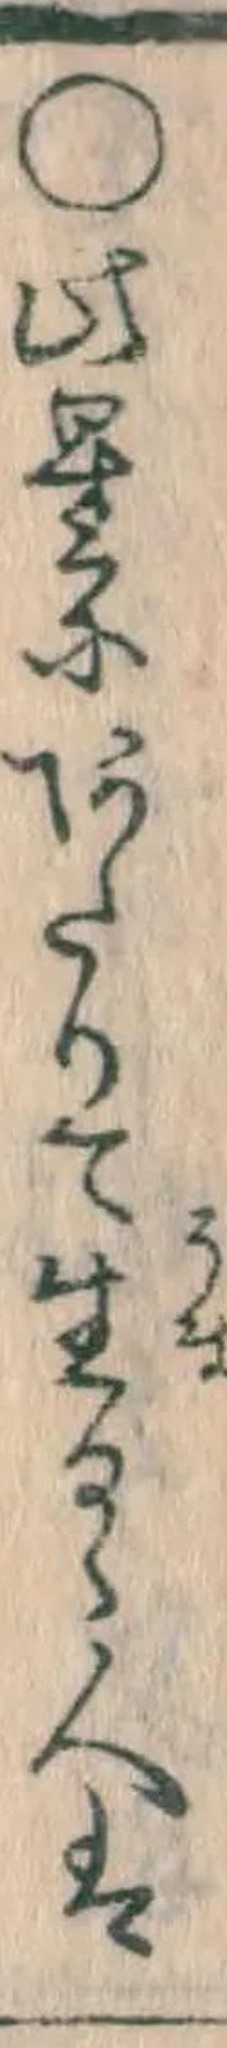○此星にあたりて生るゝ人は
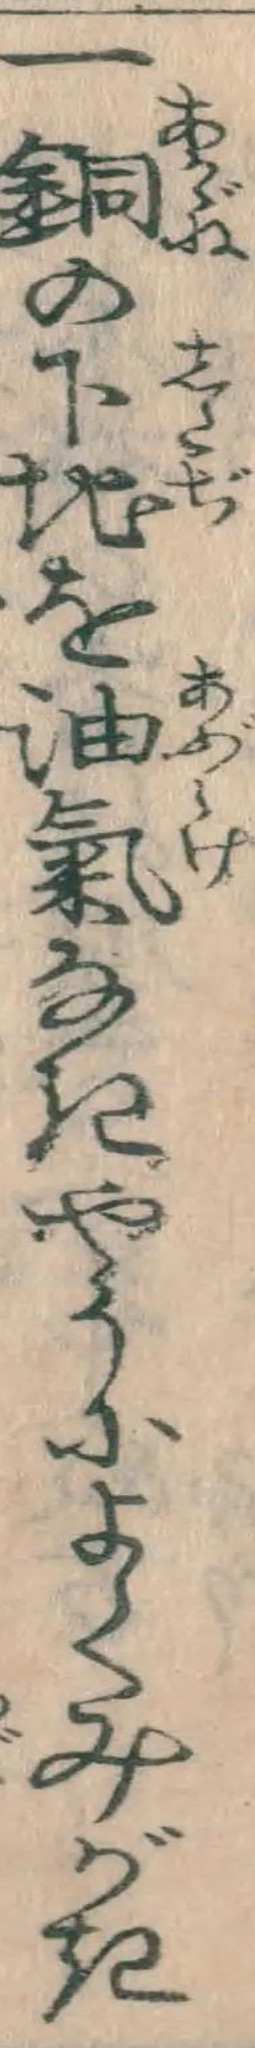一銅の下地を油気なきやうによくみがき
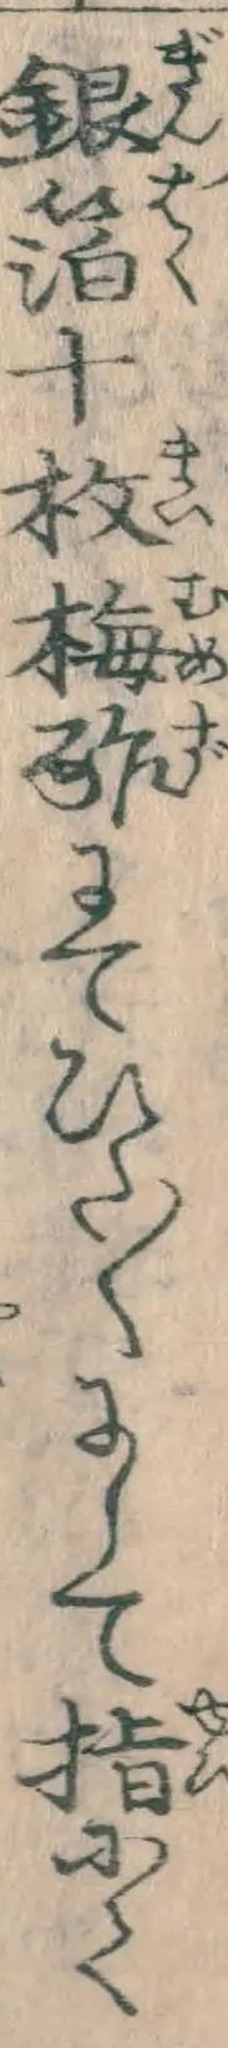銀箔十枚梅酢にてひた〳〵にして指にて
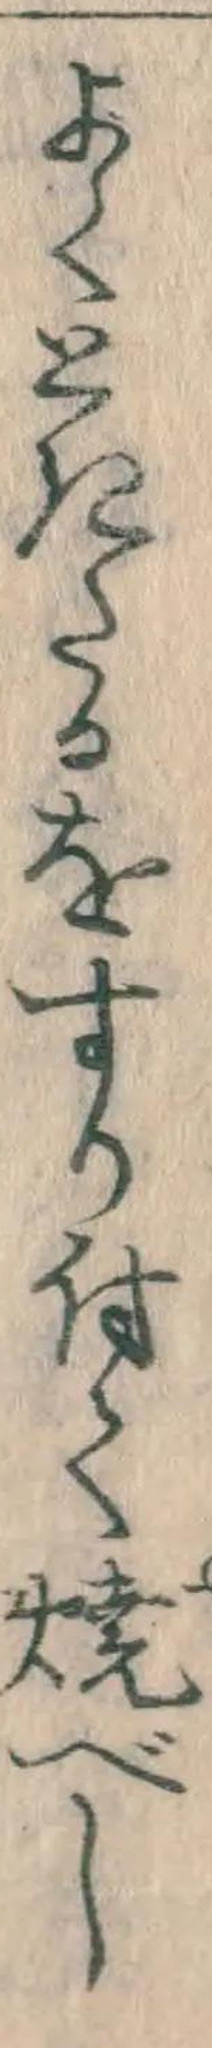よくときたるをすり付て焼べし
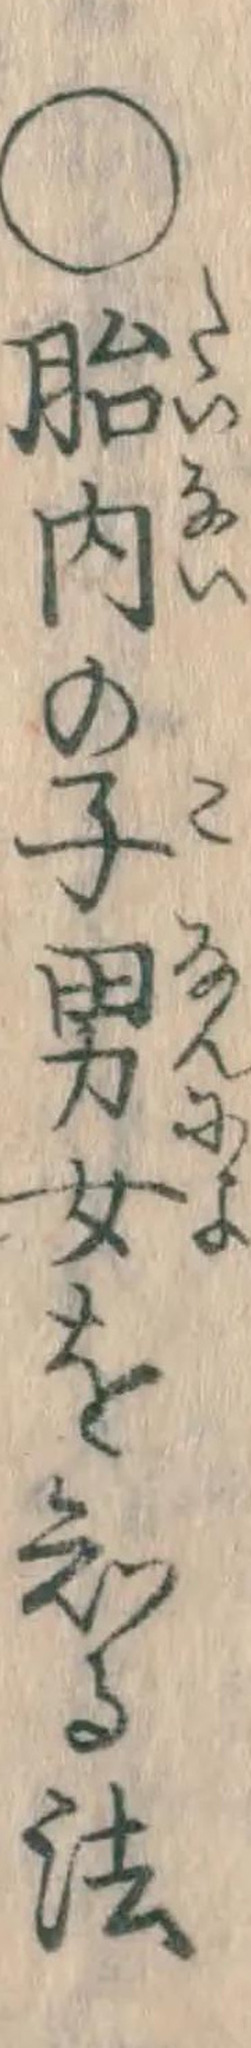○胎内の子男女を知る法
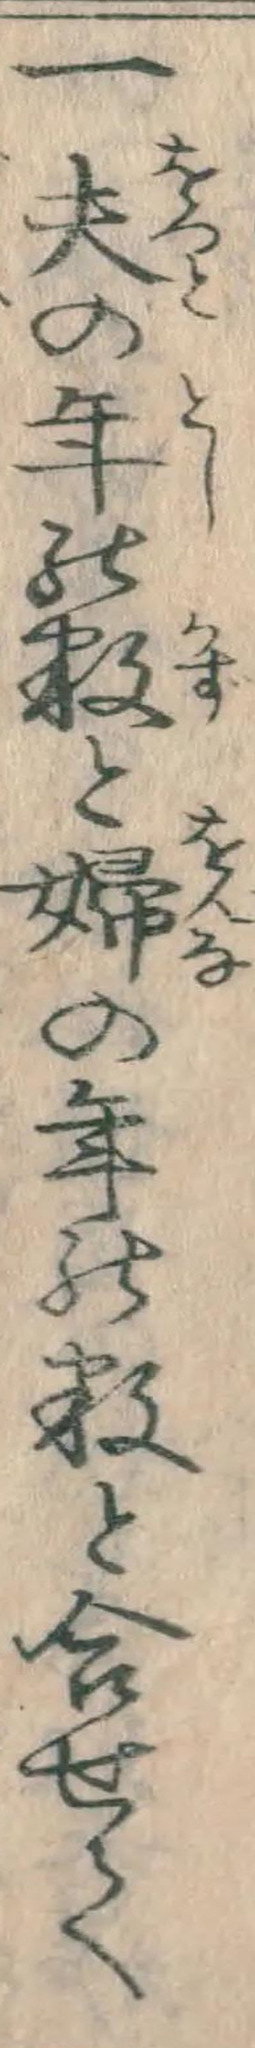一夫の年の数と婦の年の数と合せて
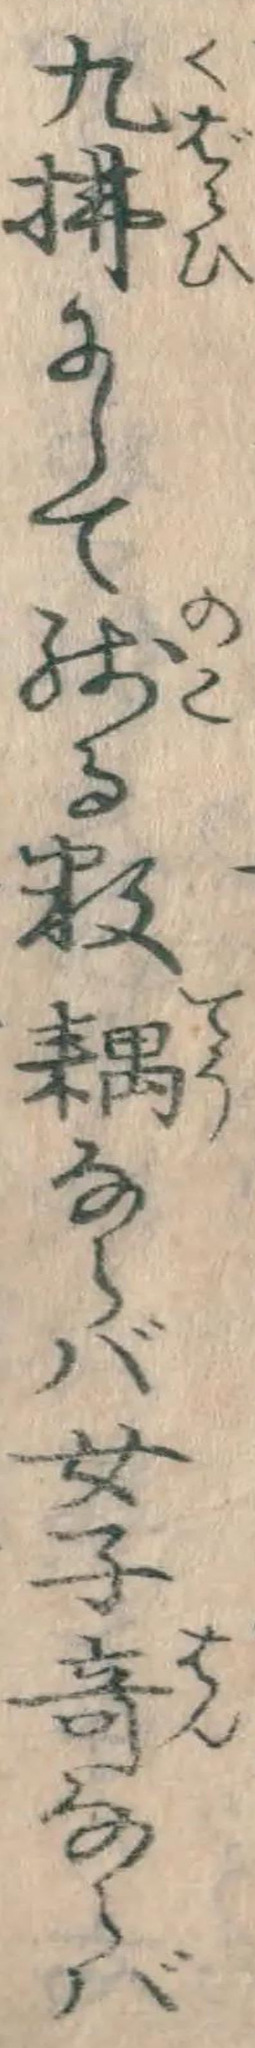九払にして残る数耦ならば女子奇ならば
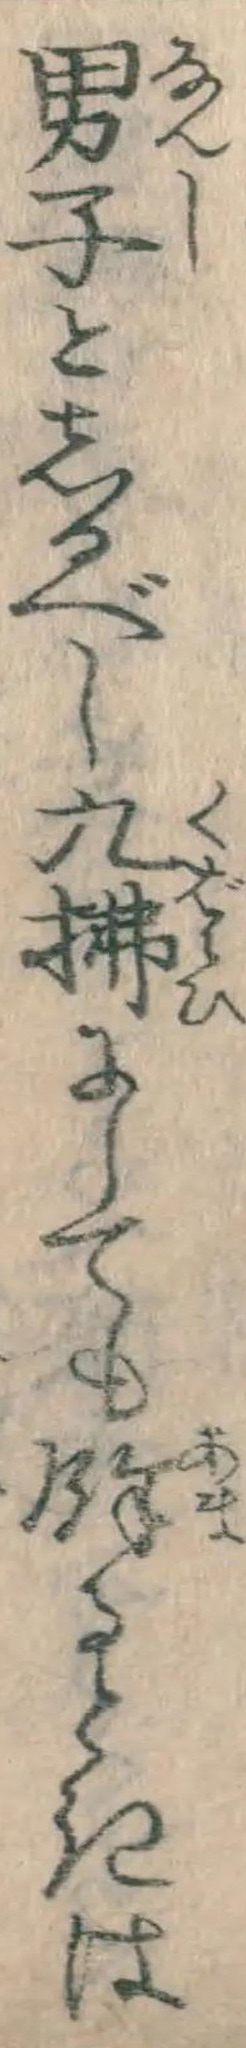男子としるべし九払にしても余るときは
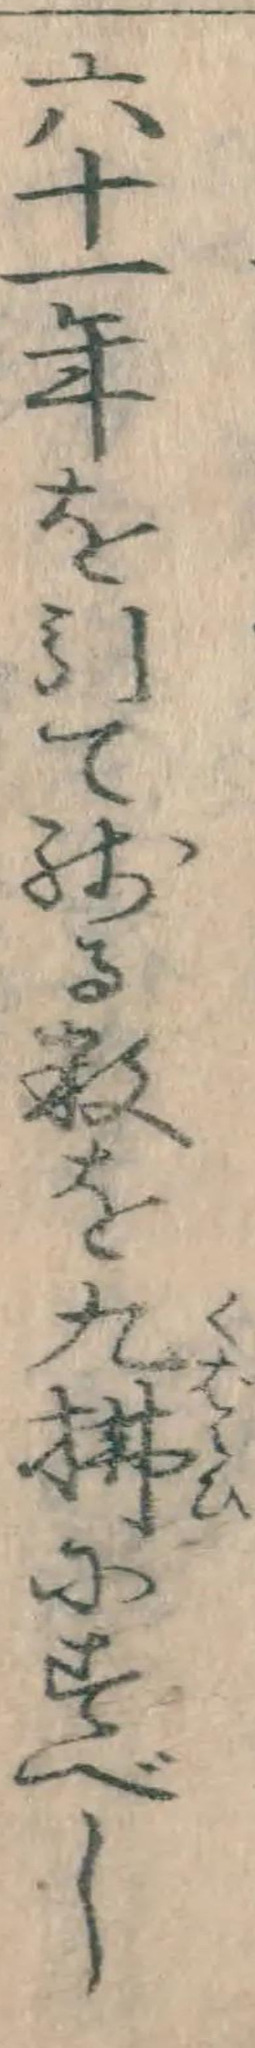六十一年を引て残る数を九払にすべし

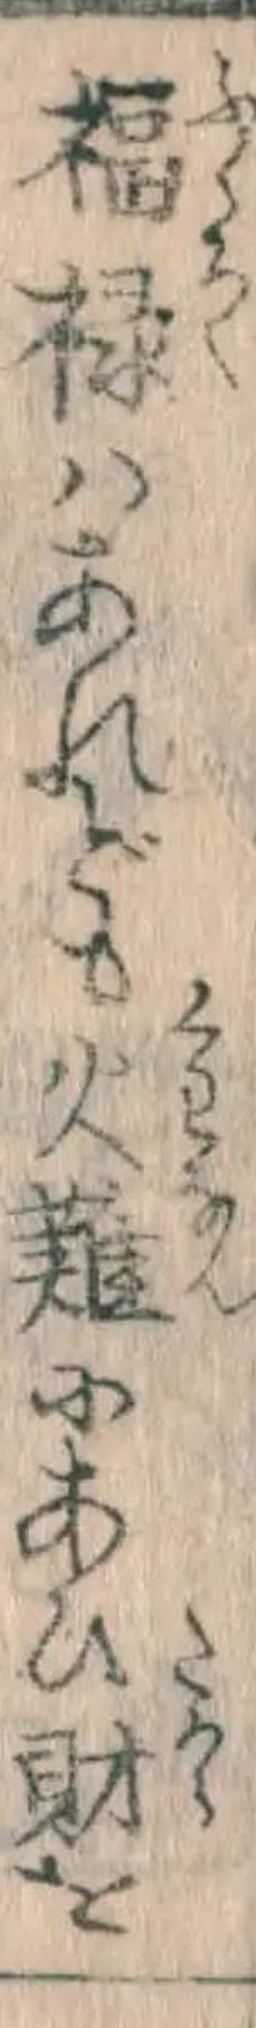福禄はあれども火難にあひ財を
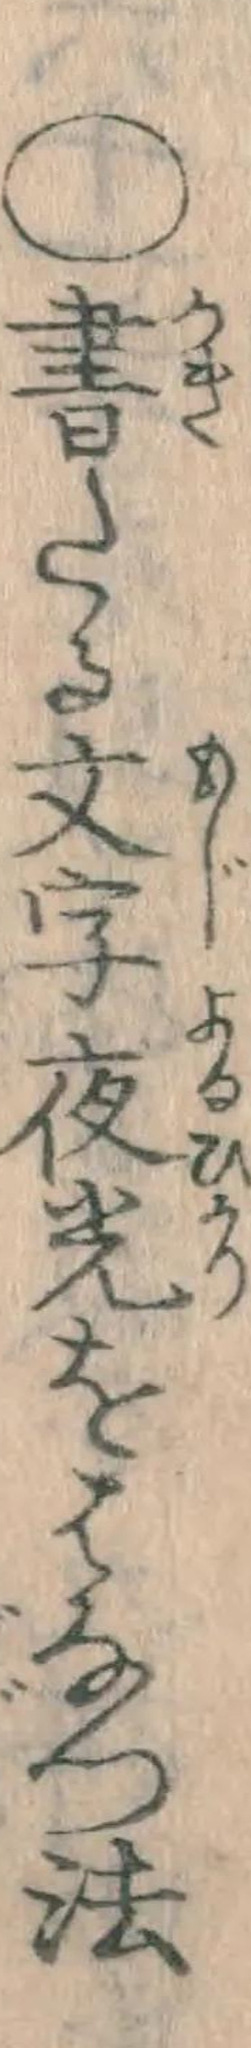○書たる文字夜光をはなつ法
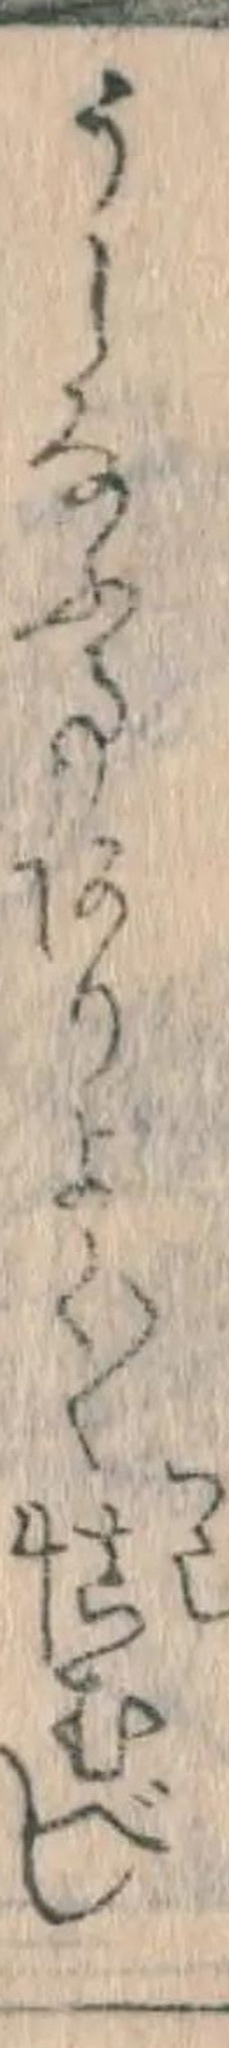うしなふ事ありよく〳〵慎むべし
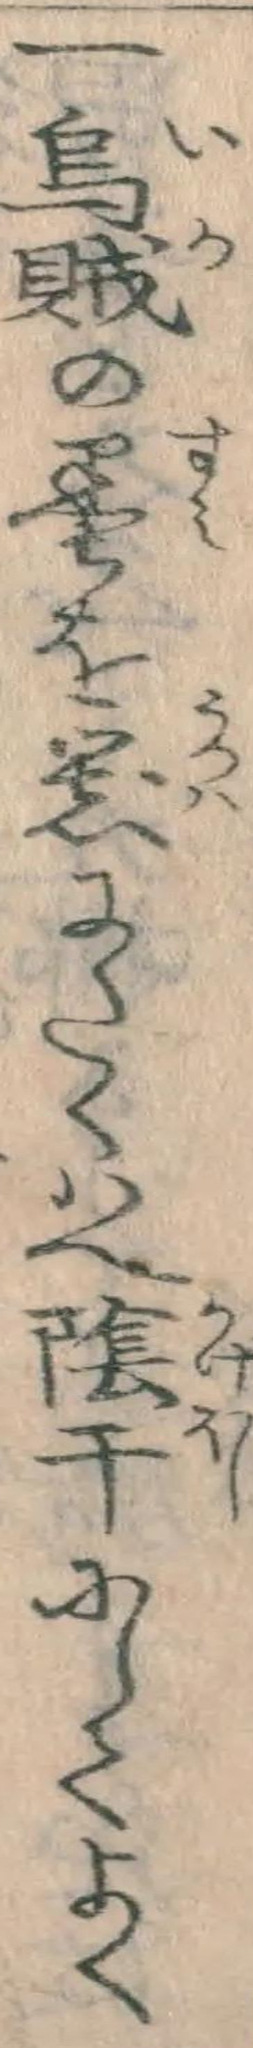一烏賊の墨を器にたくはへ陰干にしてよく
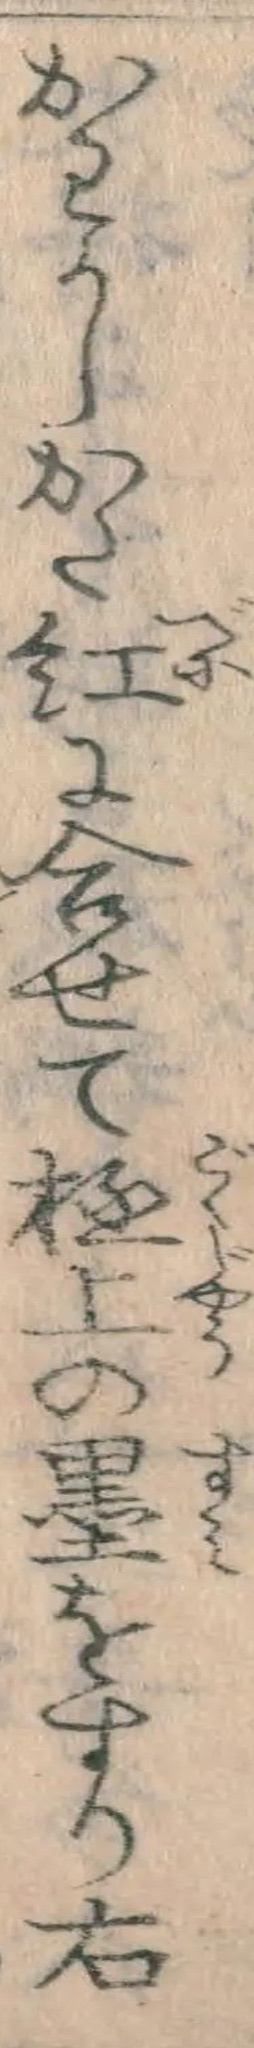かわかしかた紅に合せて極上の墨をすり右
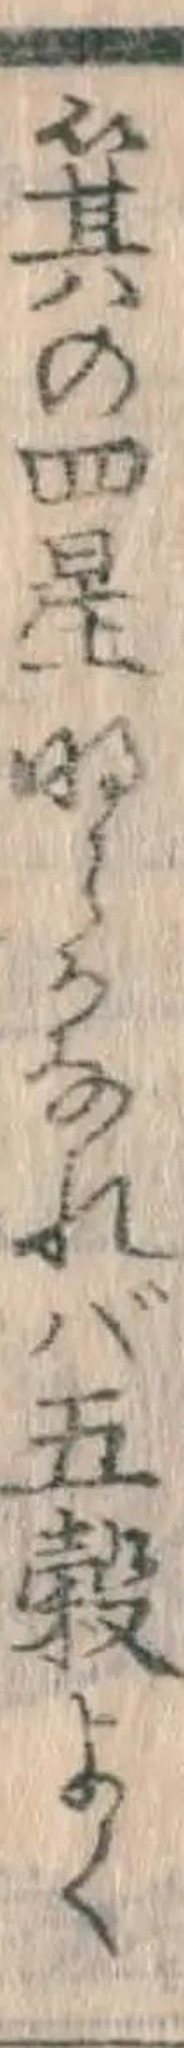箕の四星明らかなれば五穀よく
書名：広益秘事大全 3巻. [2]
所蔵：国立国会図書館 National Diet Library, JAPAN
